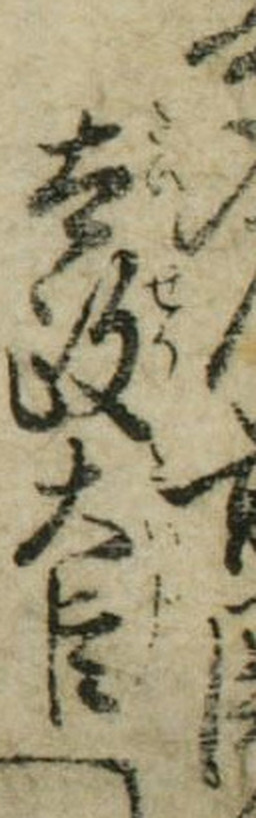太政大臣
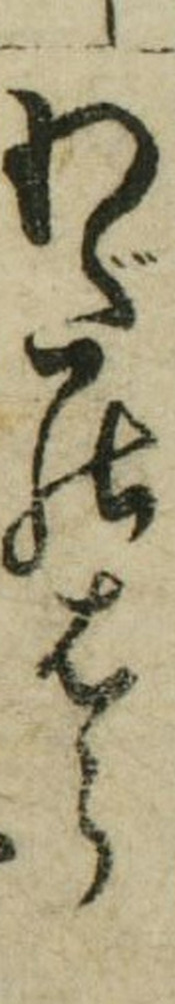わだのはら
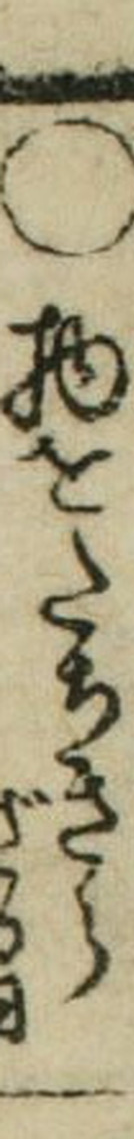○物をたちきら
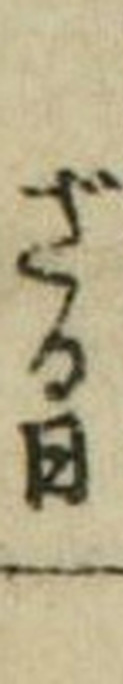ざる日
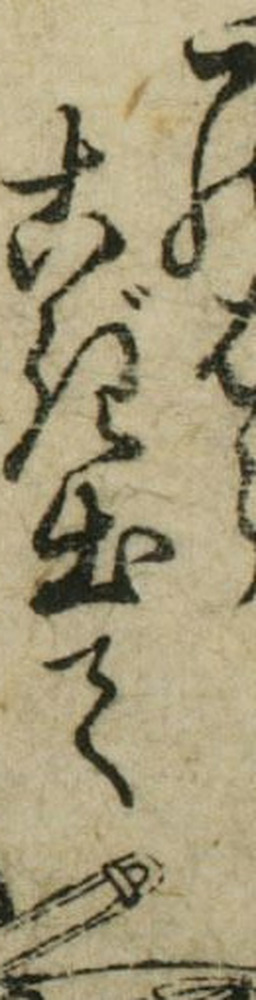こぎ出て
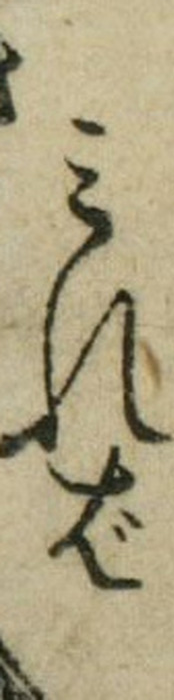みれば
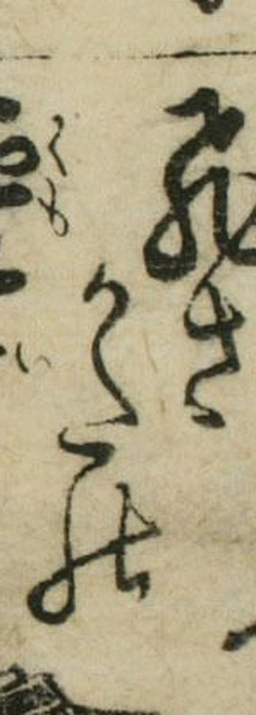かたの
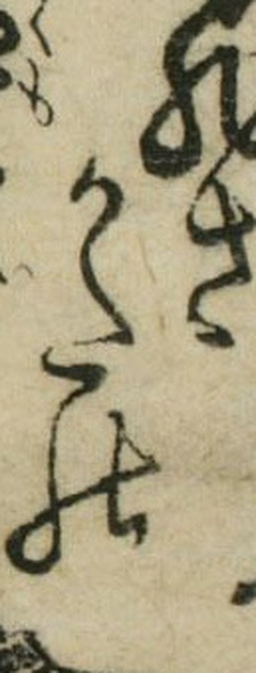かたの
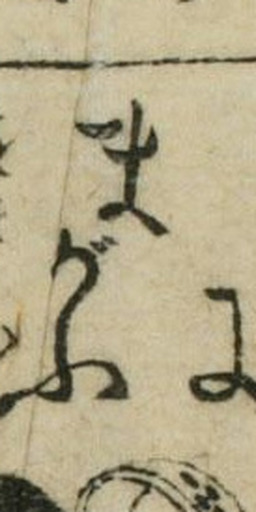まがふ
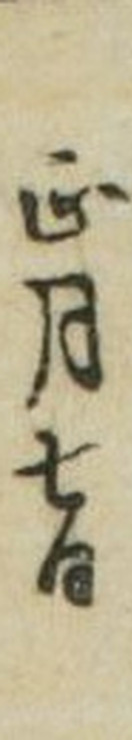正月七日
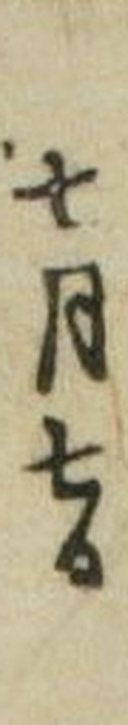七月七日
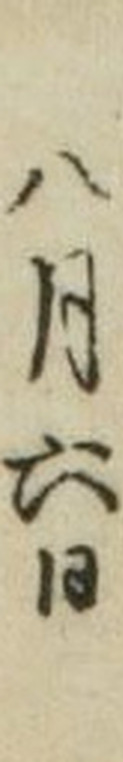八月六日
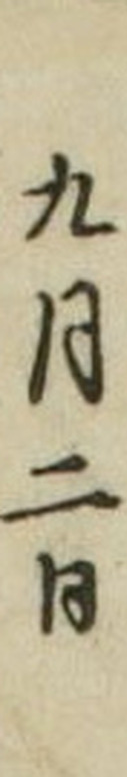九月二日
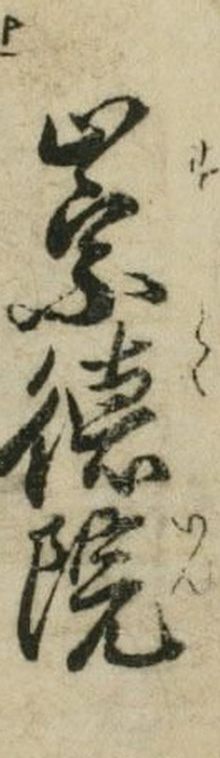崇徳院
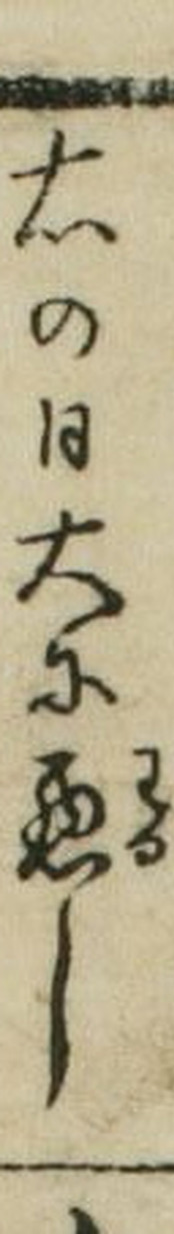右の日大に悪し
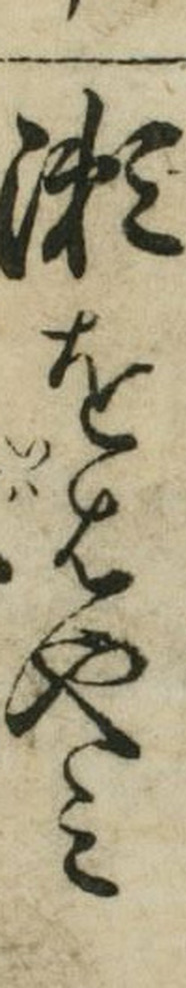瀬をはやみ
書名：百人一首
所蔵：東京学芸大学教育コンテンツアーカイブ
